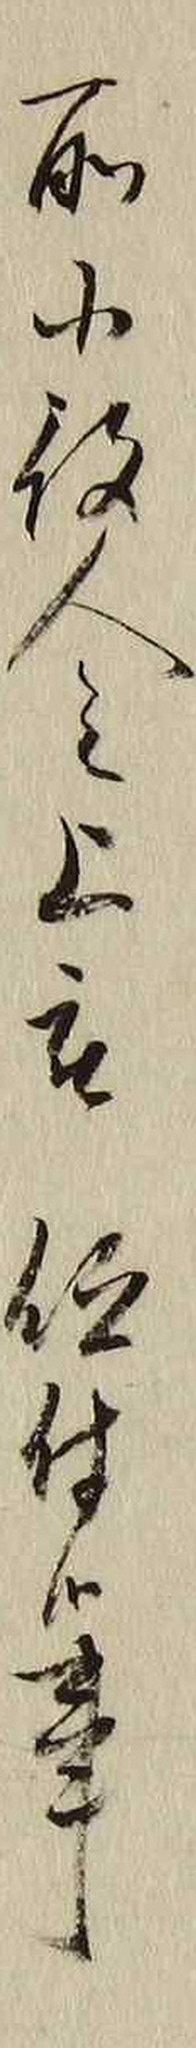所小役人之上被仰付候事
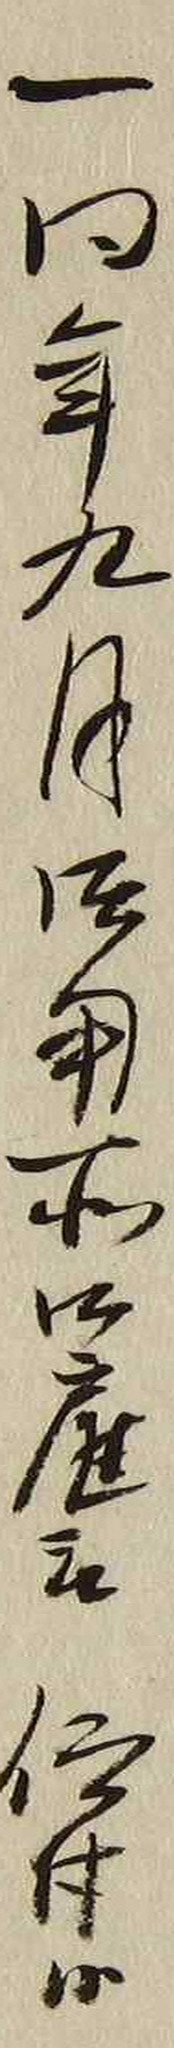一同年九月御用所御雇被仰付候
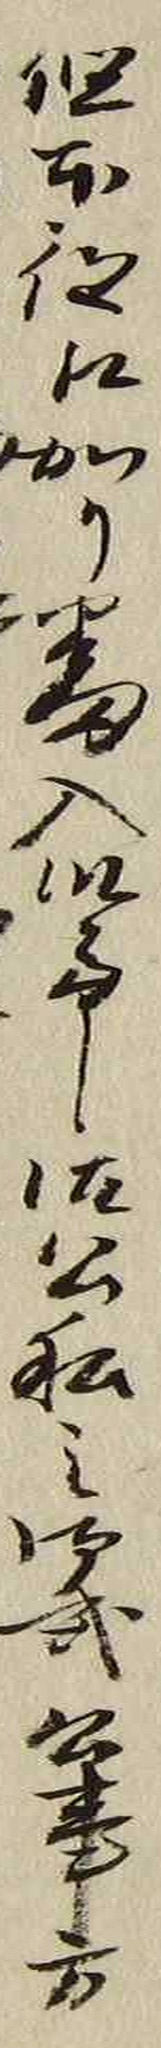但本役御江加り番入いたし御公私之御式公事方
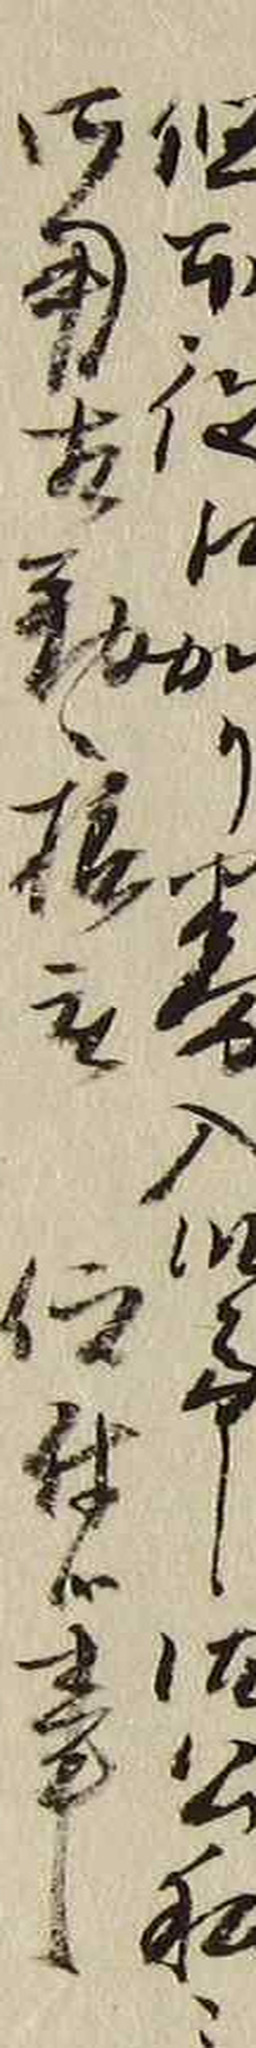御用相勤候様被仰付候事
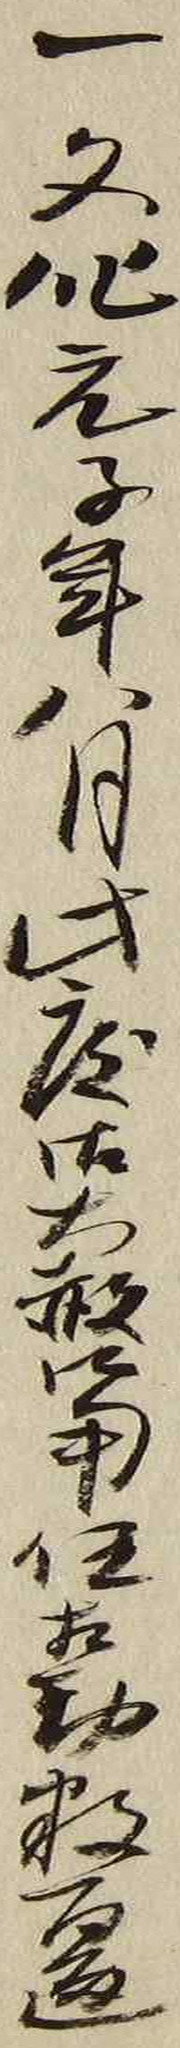一文化元子年八月此度御大赦御用任相勤数百通
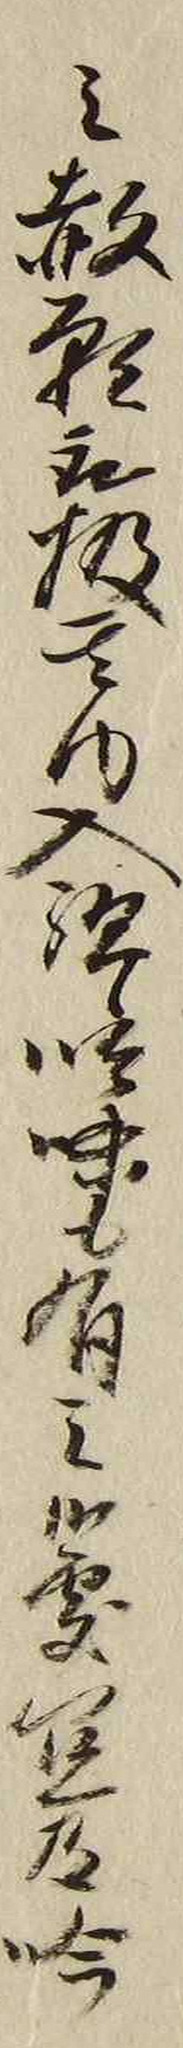之赦願取扱其内入組候吟味も有之候処宜及吟

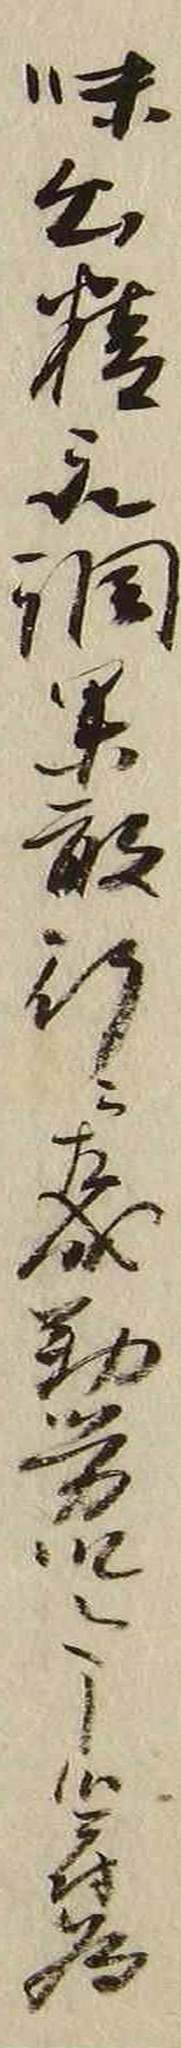味出精取調果敢行相成勤労いたし候付為
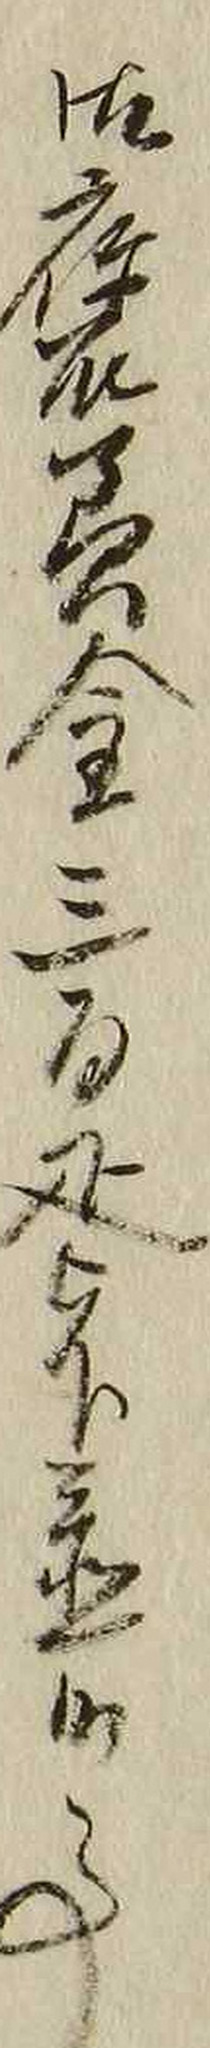御褒美金三百疋被下置候事
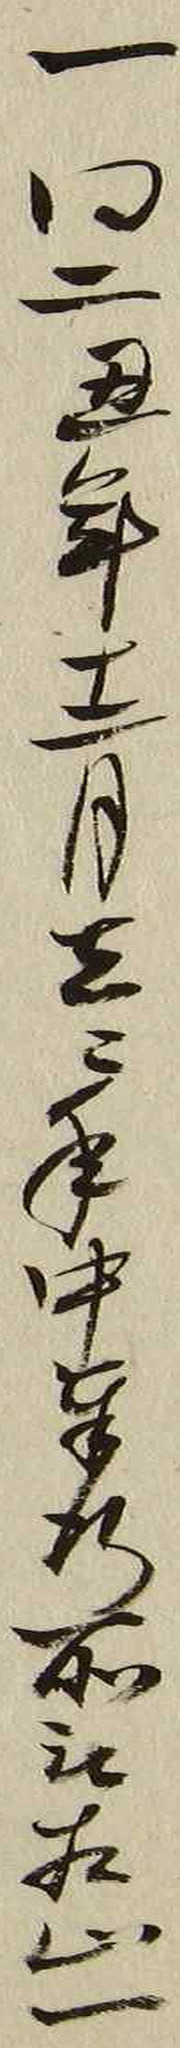一同二丑年十二月去々年中奉行所被相止一
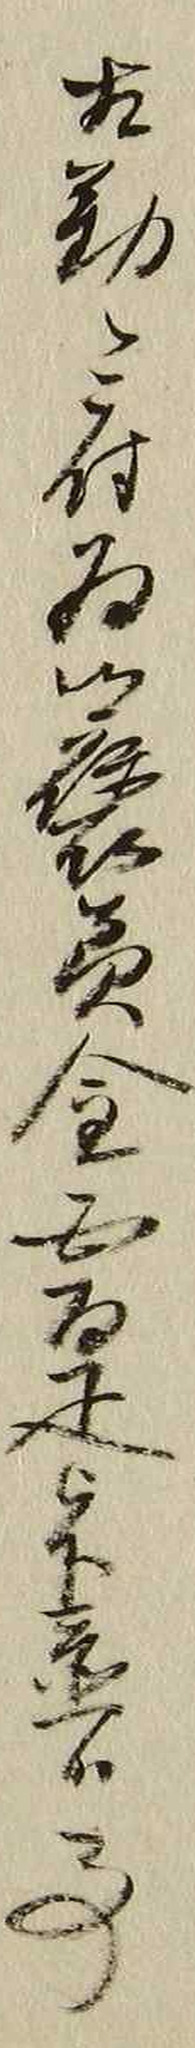相勤候付為御褒美金五百疋被下置候事
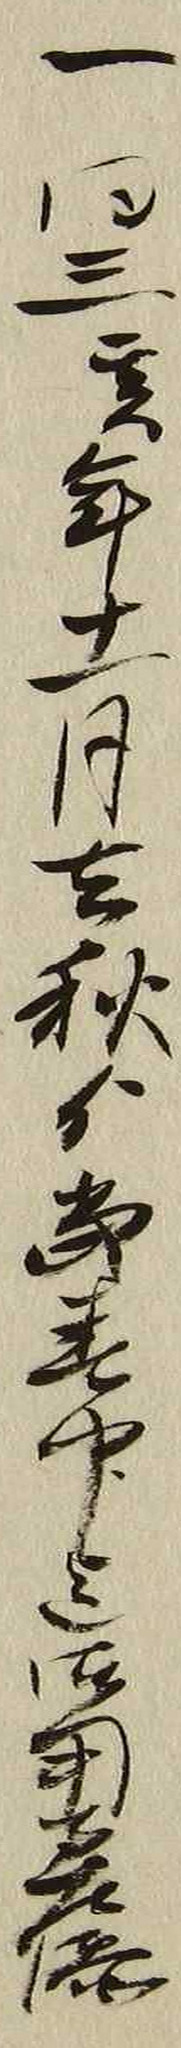一同三亥年十一月去秋ゟ当春中迄御用差添
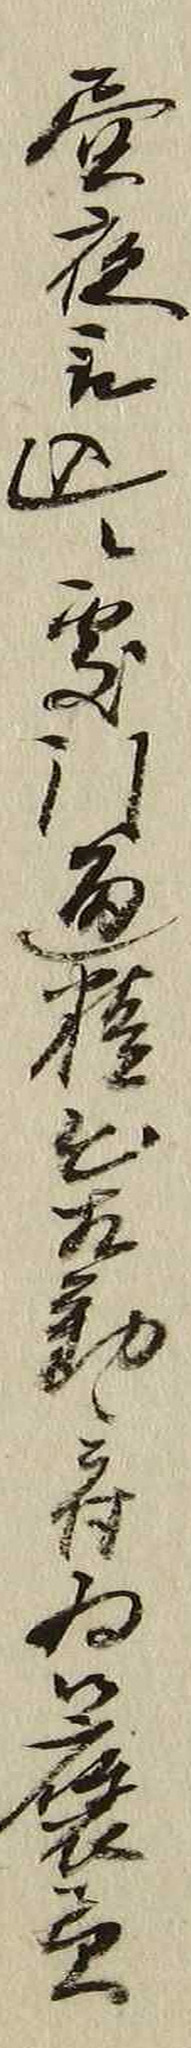昼夜取込候処引通精出相勤候付為御褒美
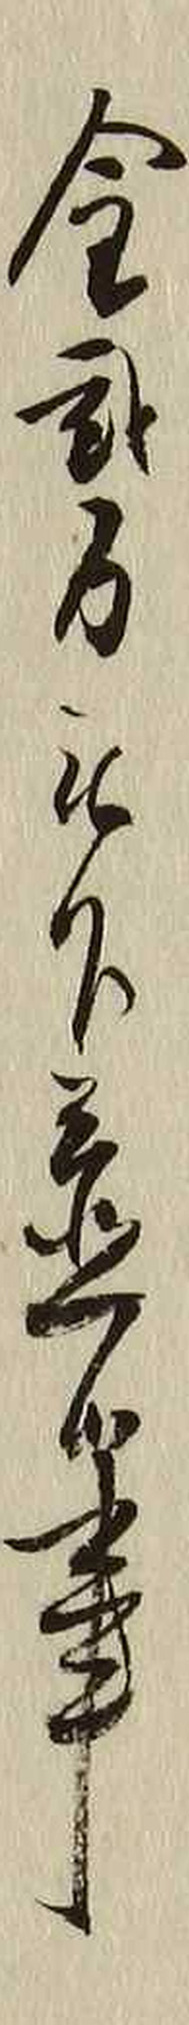金弐分被下置候事
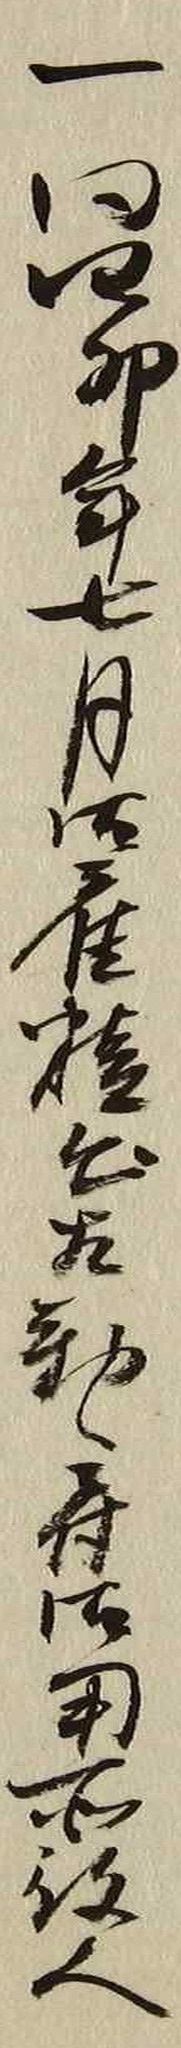一同四卯年七月御雇精出相勤候付御用所役人
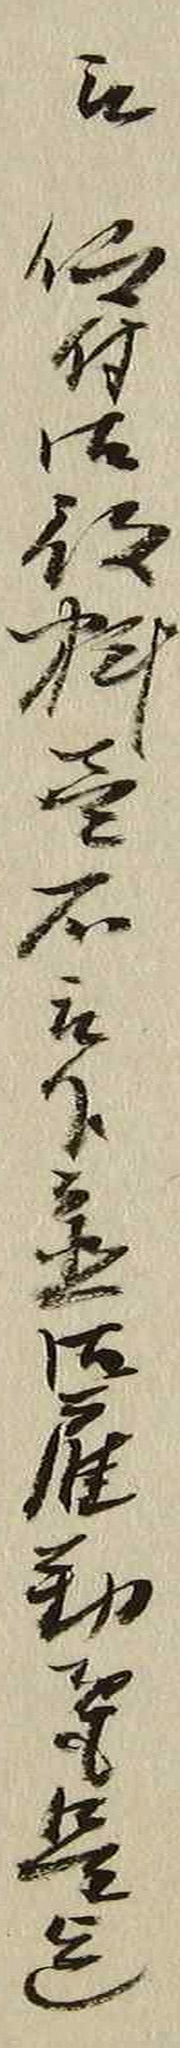被仰付御役料壱石被下置御雇勤をも是迄
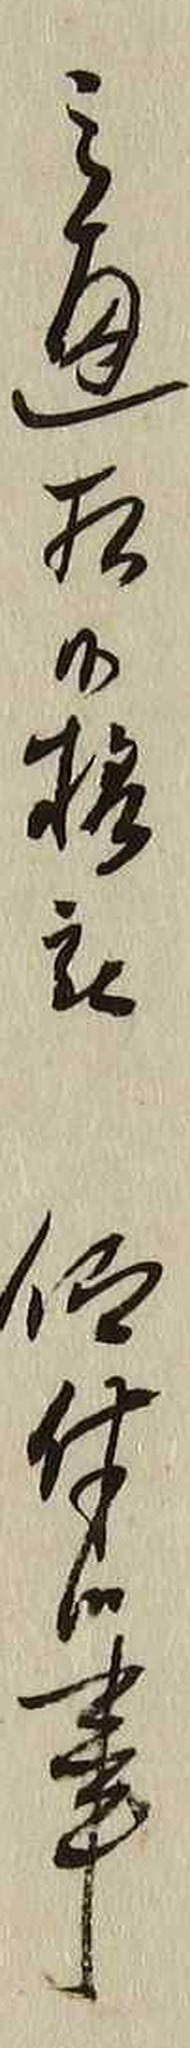之通相候様被仰付候事
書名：諸士系譜　巻之350　せ之部1冊全
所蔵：会津若松市立会津図書館
